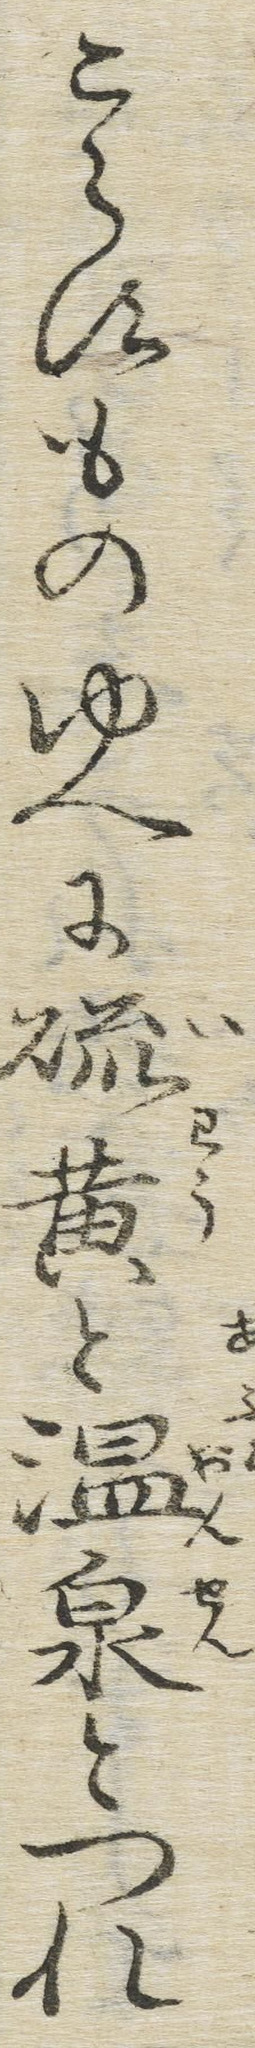こらすものゆへに硫黄と温泉とつれ
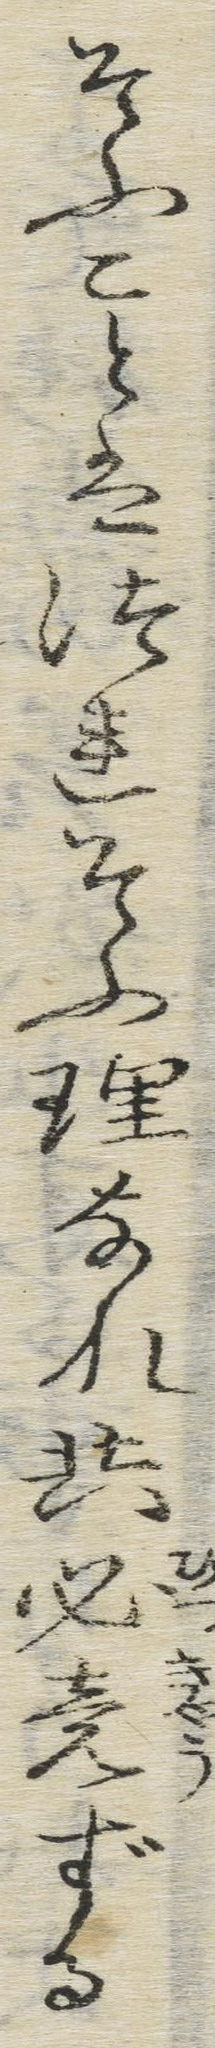そふことはつれそふ理なれ共必竟ずる
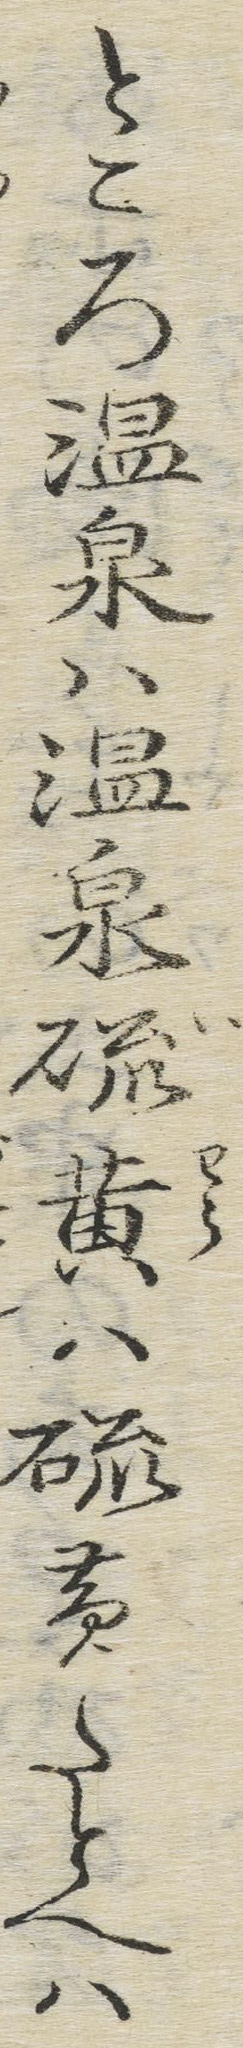ところ温泉は温泉硫黄は硫黄たとへは
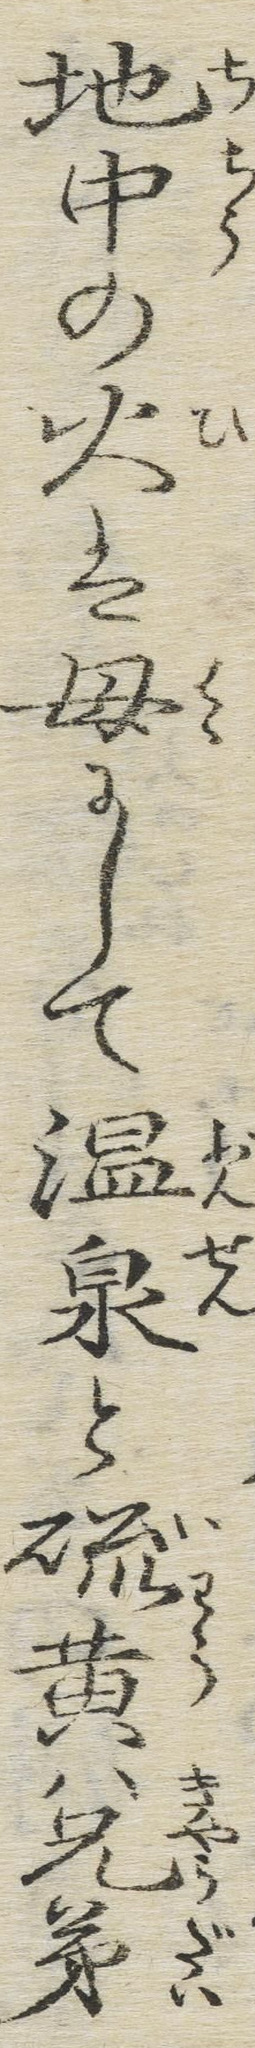地中の火は母にして温泉と硫黄は兄弟
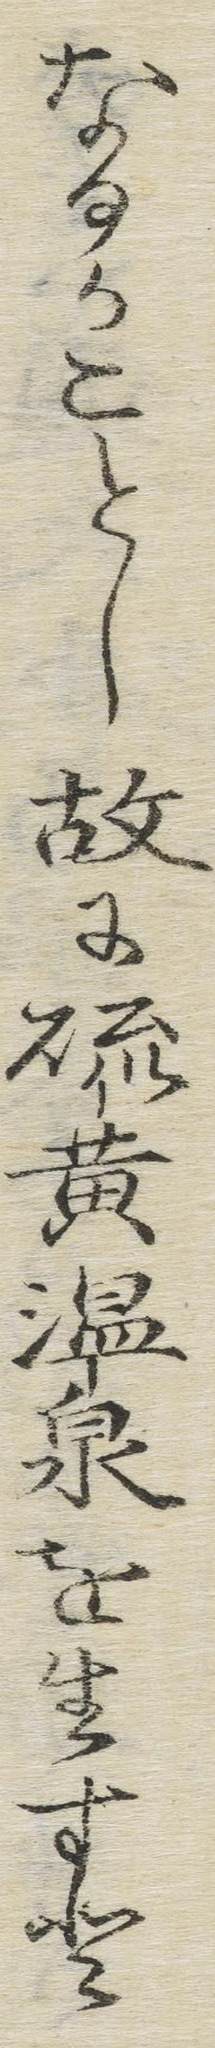なるかことし故に硫黄温泉を生すと
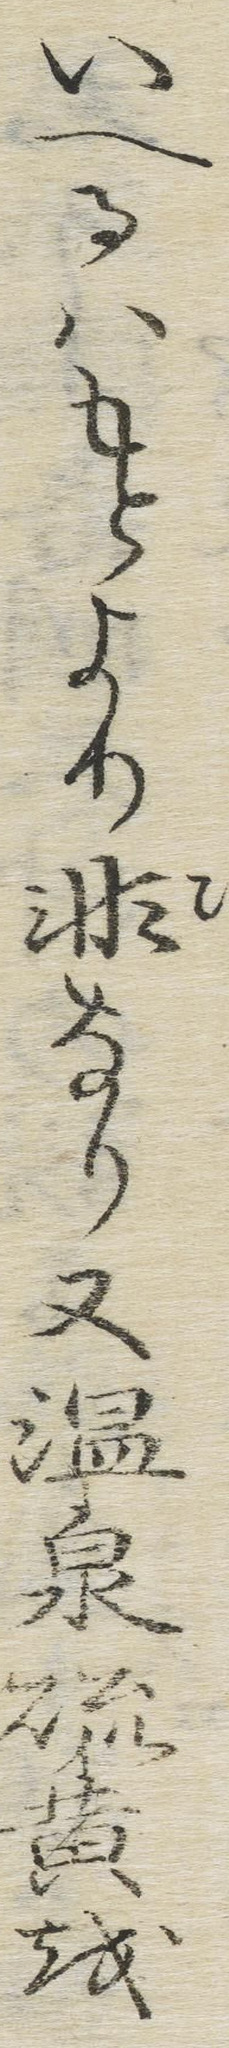いへるはもとより非なり又温泉硫黄を
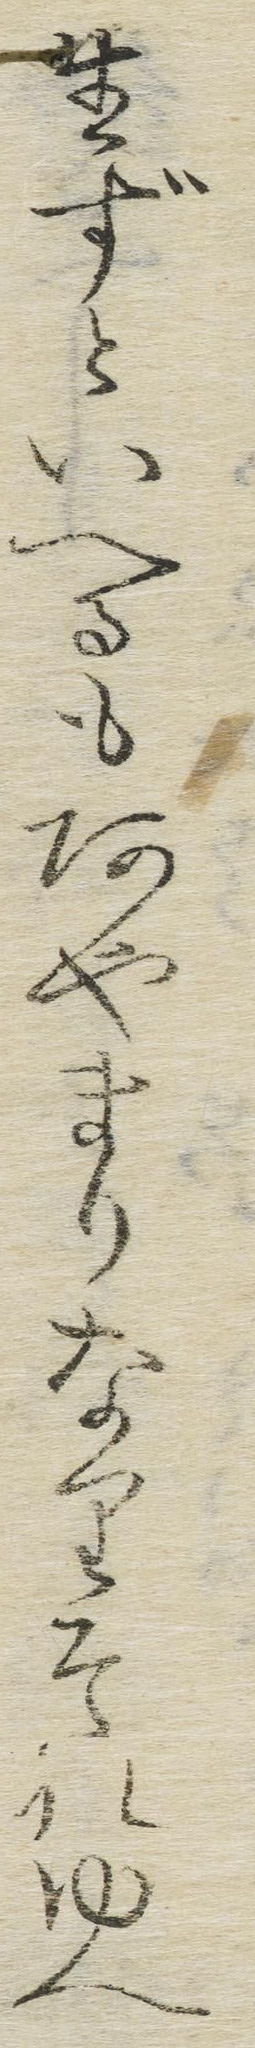生ずといへるもあやまりなりそれゆへ
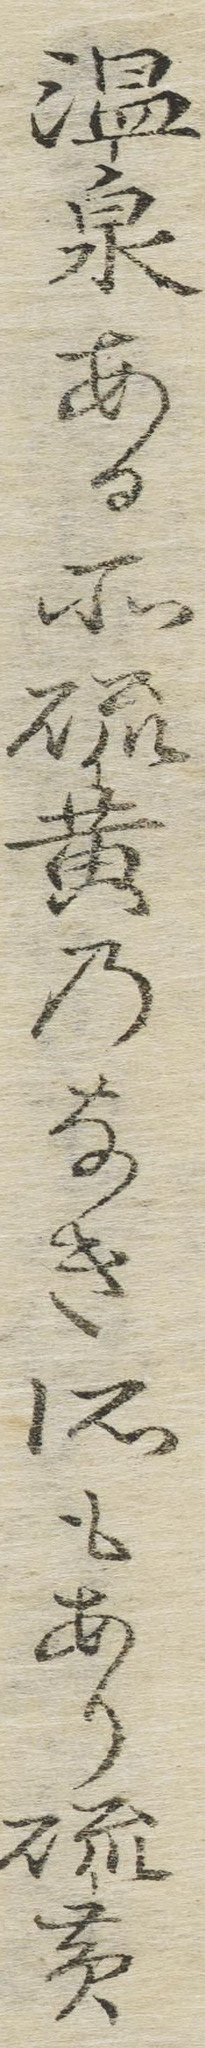温泉ある所硫黄のなき所もあり硫黄
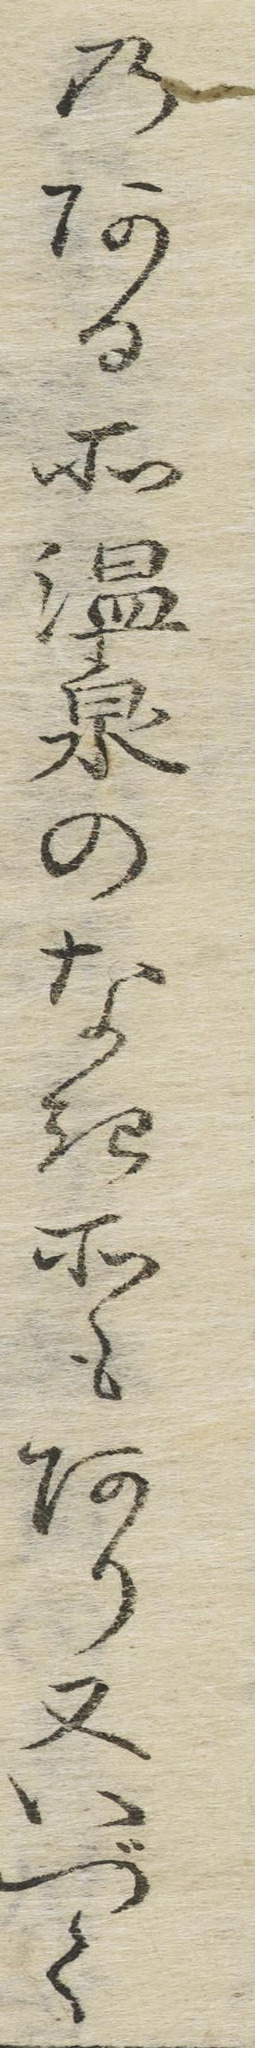のある所温泉のなき所もあり又いづく

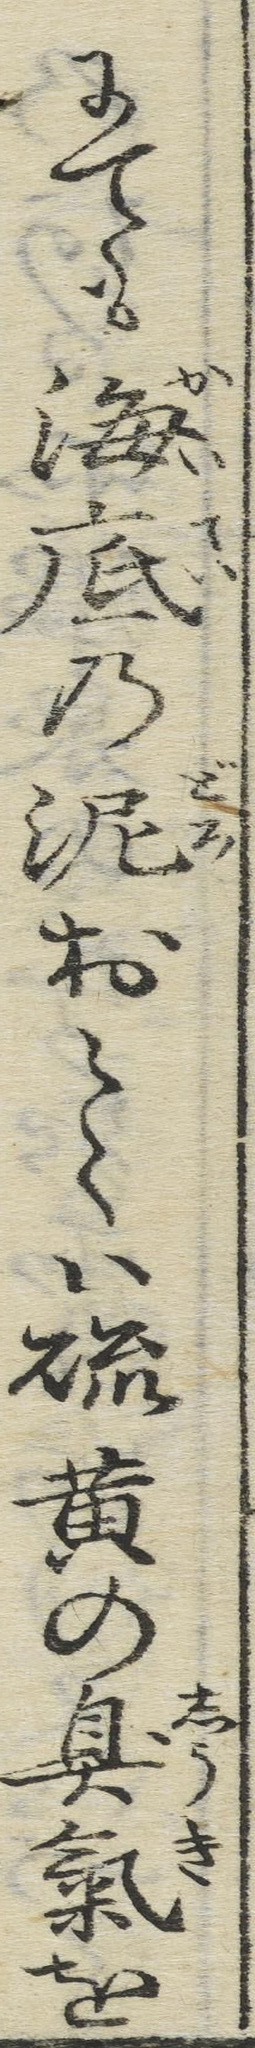にても海底の泥おゝくは硫黄の臭気を
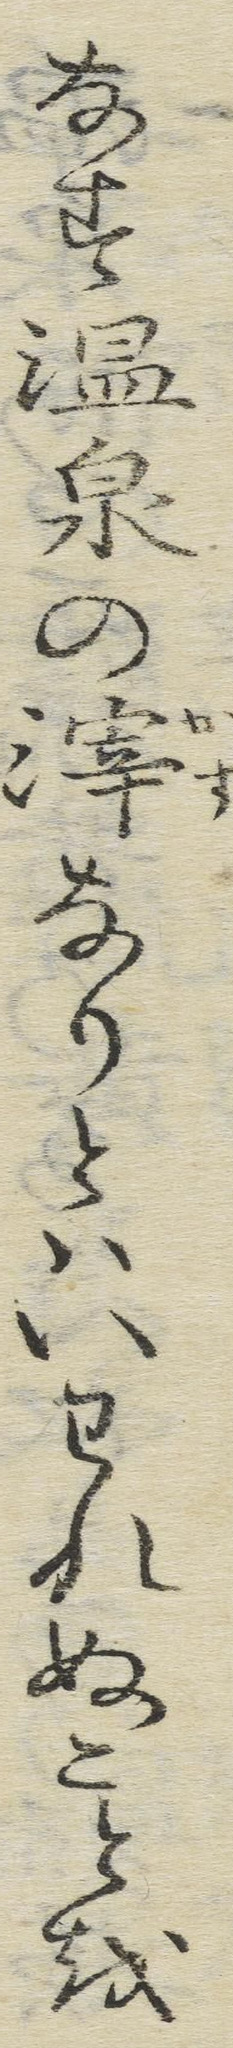なす温泉の滓なりとはいわれぬことを
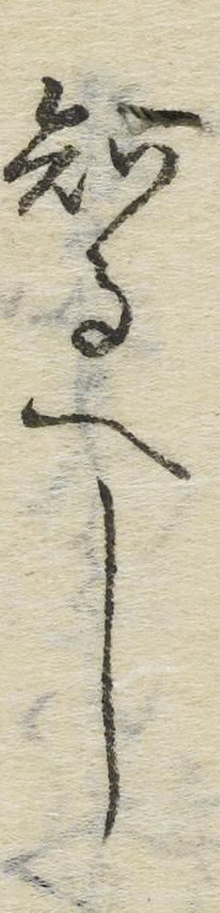知るへし
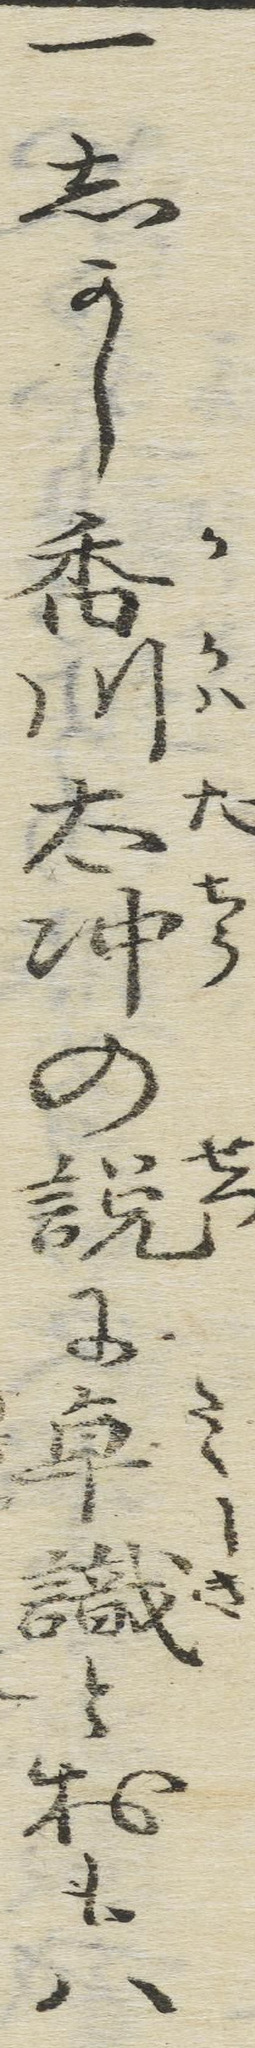一しかし香川太冲の説に卓識とおもは
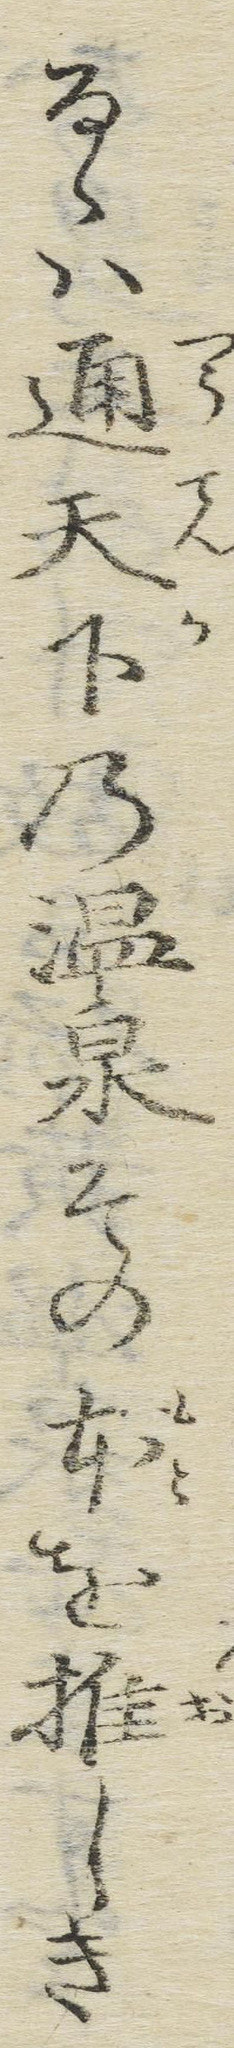るゝは通天下の温泉その本を推しき
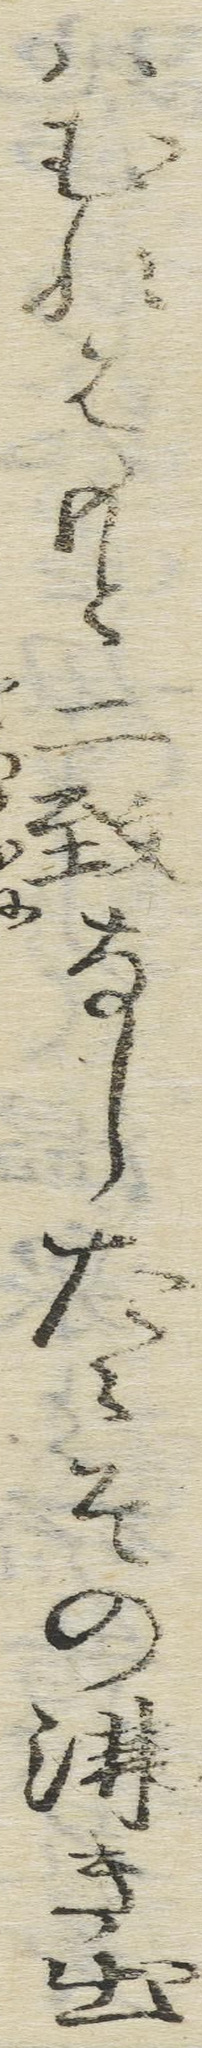はむれはもと二致なしたゝその沸き出
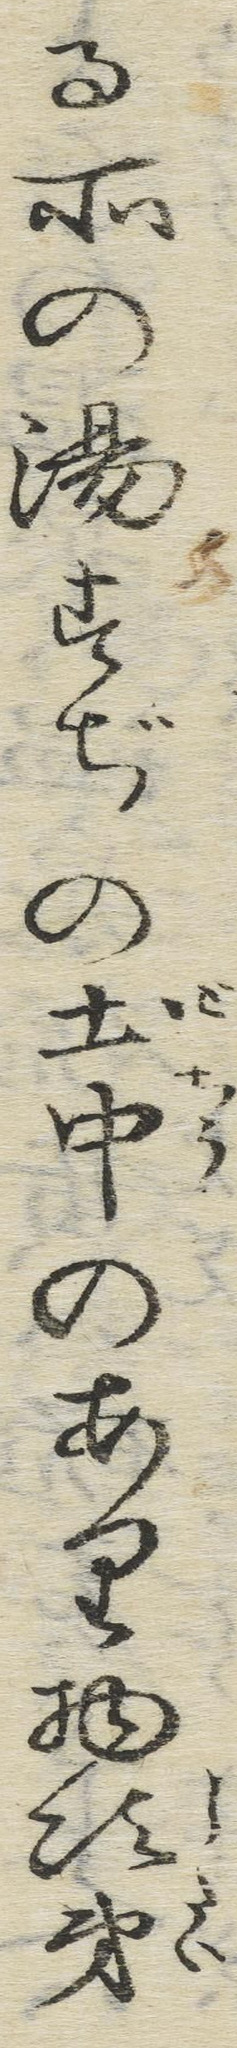る所の湯すぢの土中のあり物次第
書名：温泉考
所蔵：東京大学地震研究所図書室 Earthquake Research Institute Library, The University of Tokyo, JAPAN
